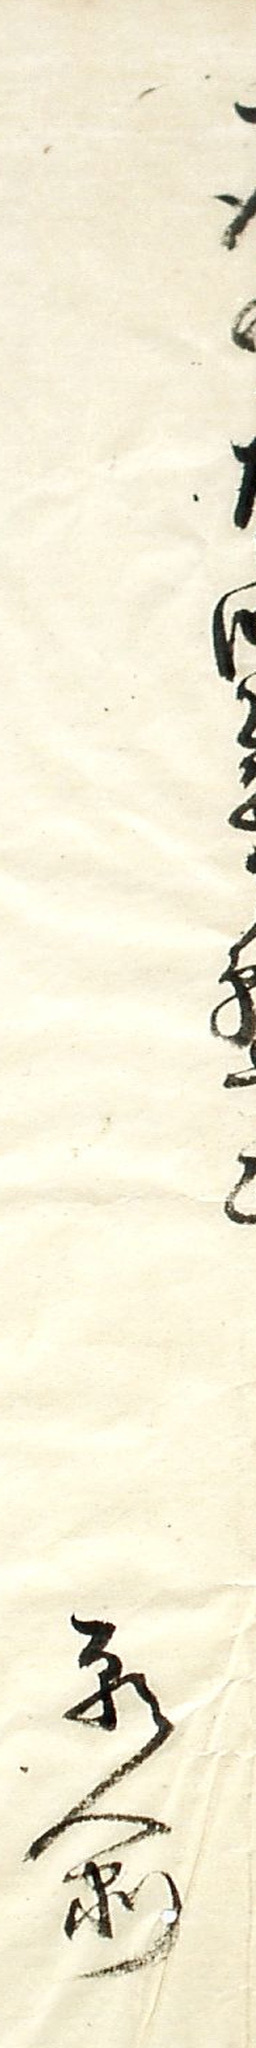願人判
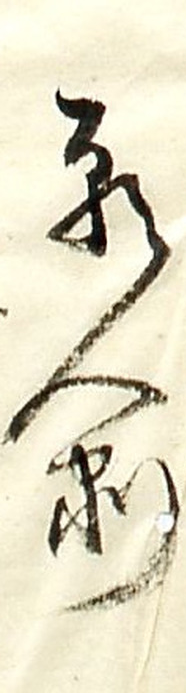願人判
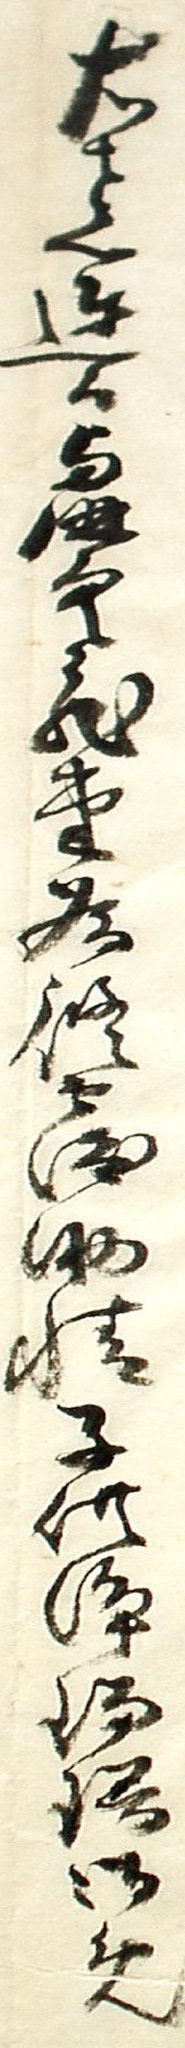右者先達而虚空蔵堂為修覆助情子供浄瑠璃御免
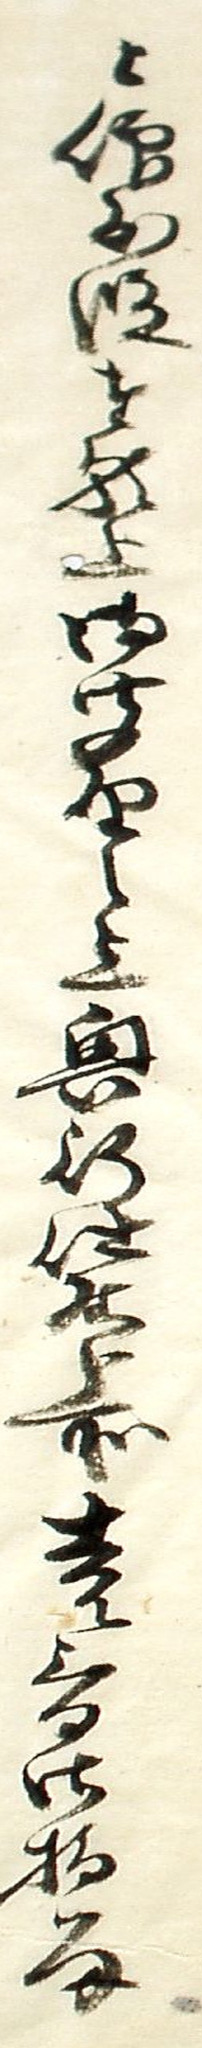被仰度段奉願上御聞届之上興行仕居申所去ル三日御指留
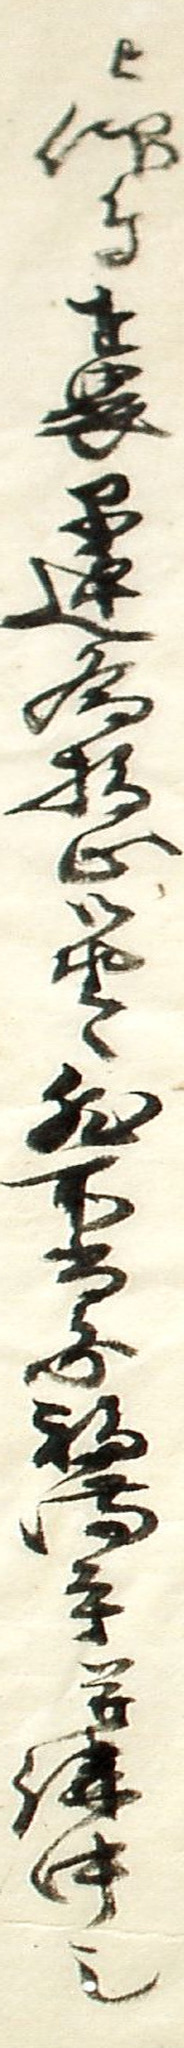被仰付奉畏早速為指止御坐候然所当分福満寺幷講中之
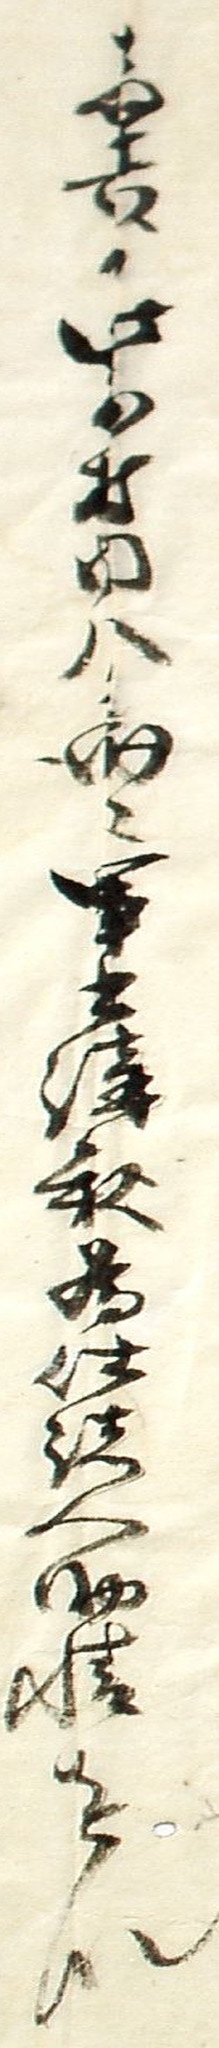者共ゟ此度村内八兵衛ニ軍書講釈為仕諸人助情を以
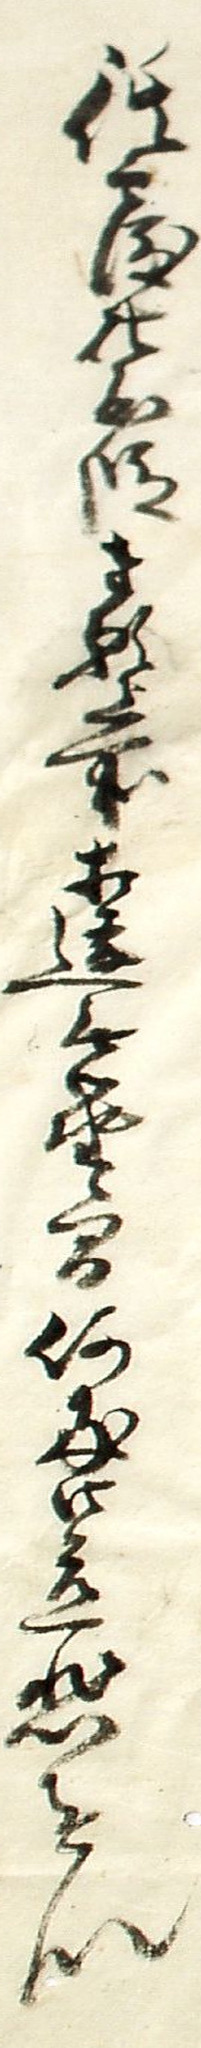修覆仕度段奉願上所相違無御坐候間何卒御慈悲を以
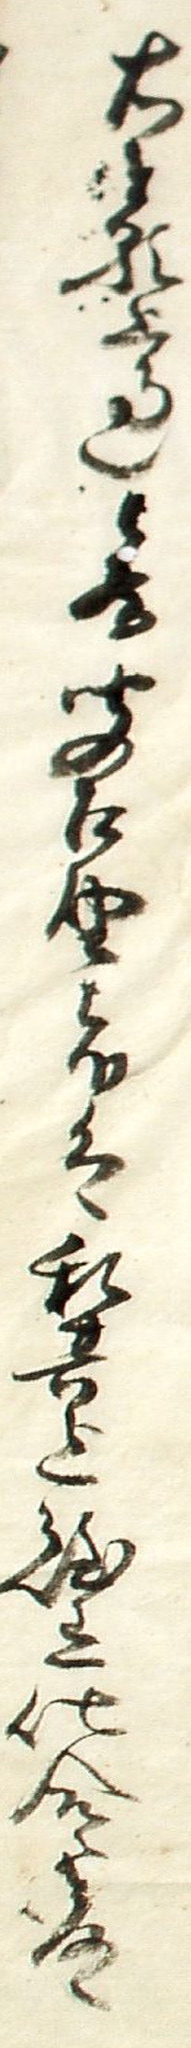右奉願上通被為聞召届被下候ハヽ私其共迄難有仕合ニ奉存候
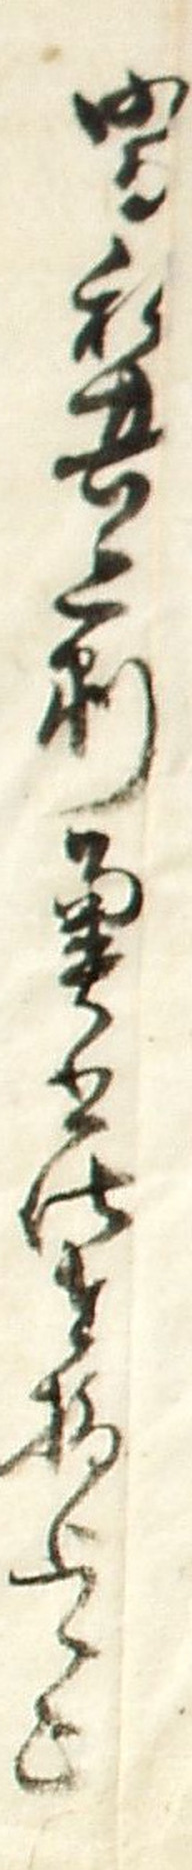仍而私共連判奥書仕奉指上候以上
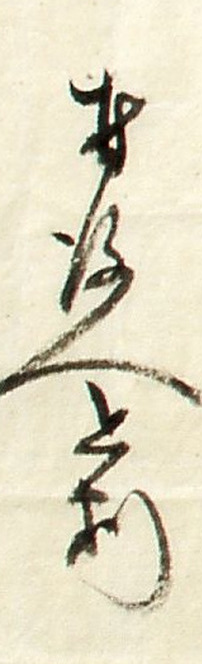村役人連判

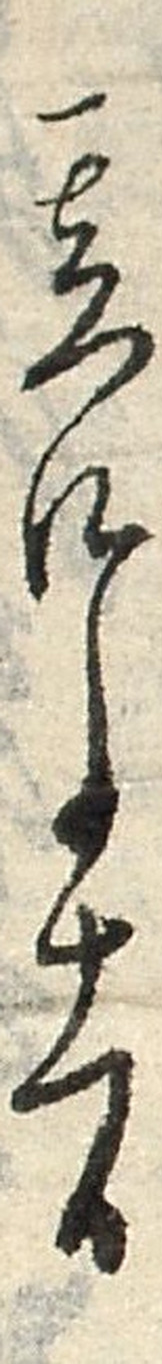亥四月十一日
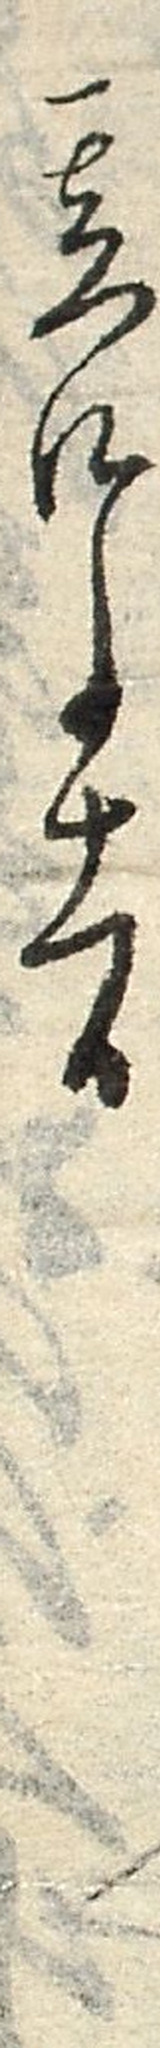亥四月十一日

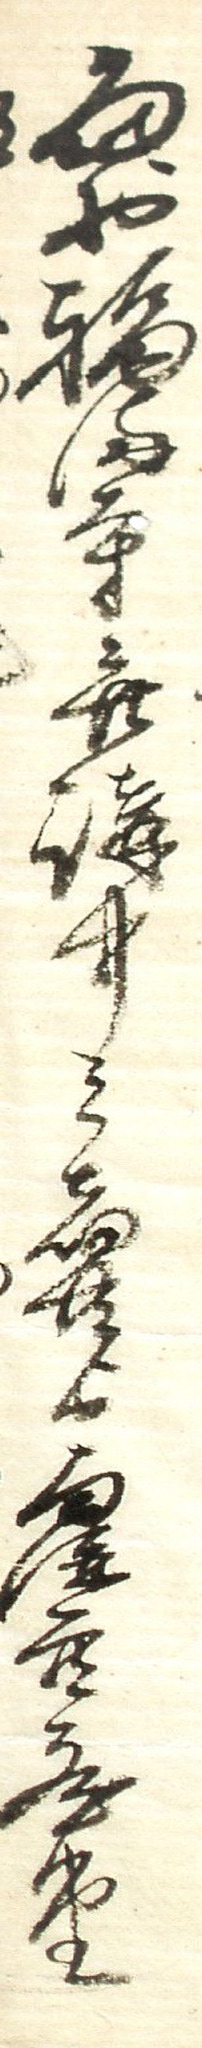當村福満寺幷講中之者共ゟ虚空蔵堂
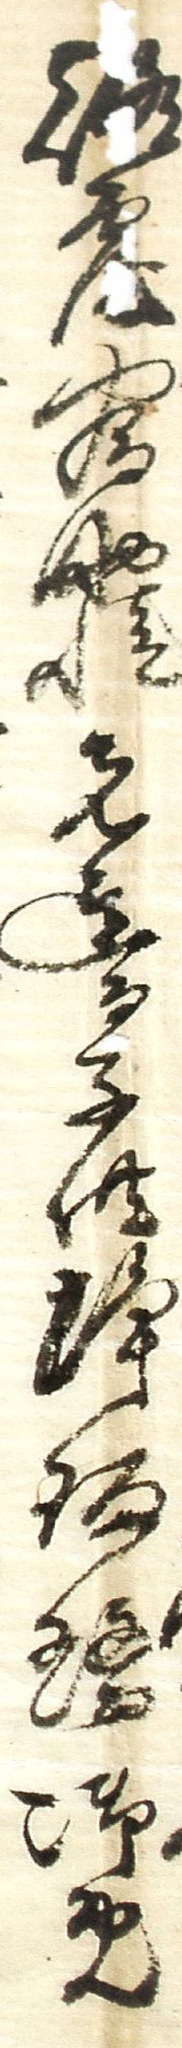修覆為助情先達而子供浄瑠璃御免
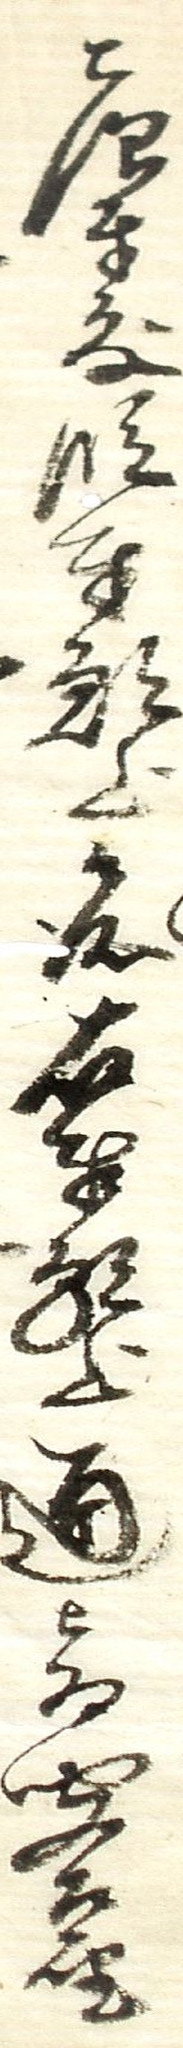被仰付度段奉願上候所右奉願上通被為聞召届
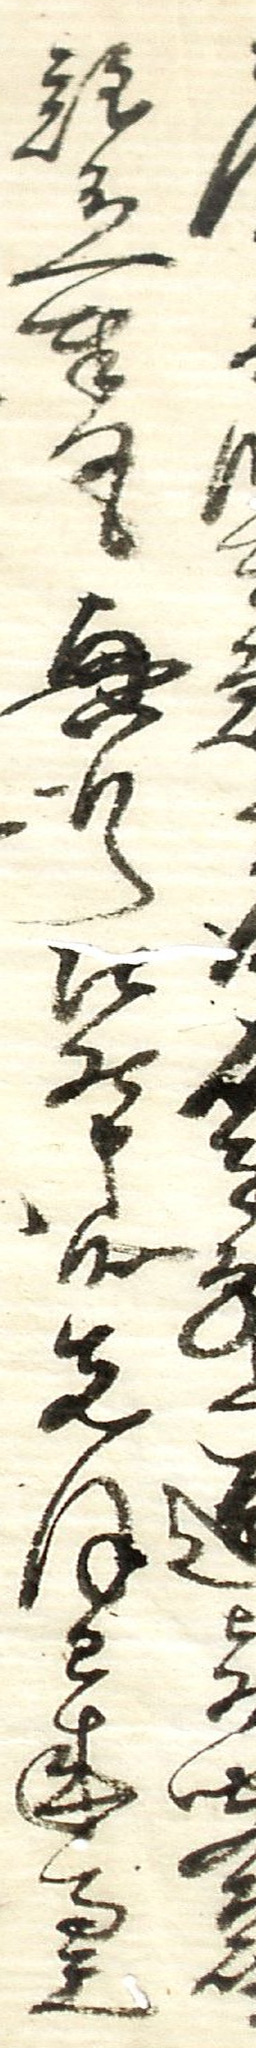難有奉存候興行仕居申所先月已来雨天
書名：(早渕村福満寺子供浄瑠璃願書）他
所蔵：鳴門教育大学 Naruto University of Education
